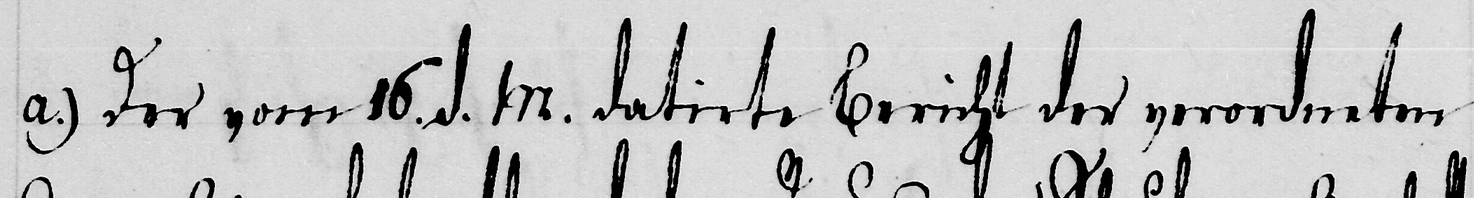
a.) Der vom 16. d. M. datirte Bericht der verordneten
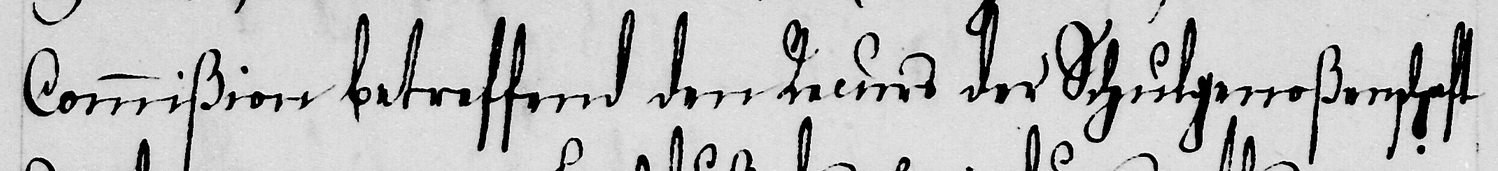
Commißion betreffend den Recurs der Schulgenoßenschaft
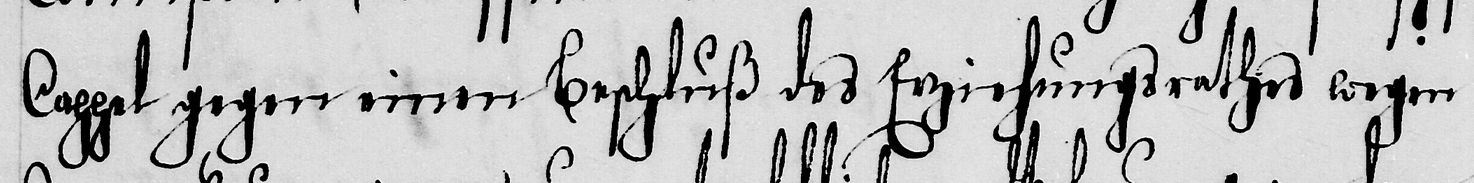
Cappel gegen einen Beschluß des Erziehungsrathes wegen
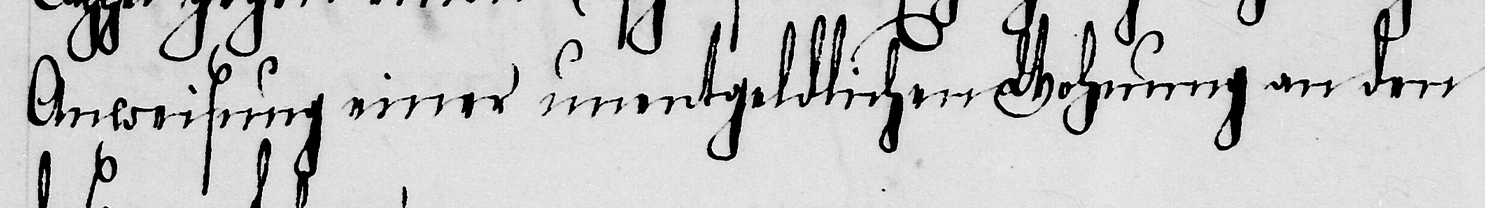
Anweisung einer unentgeldlichen Wohnung an den
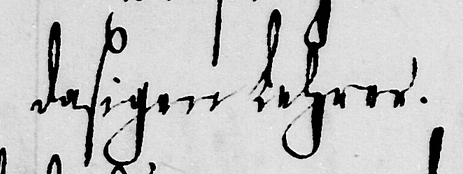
dasigen Lehrer.
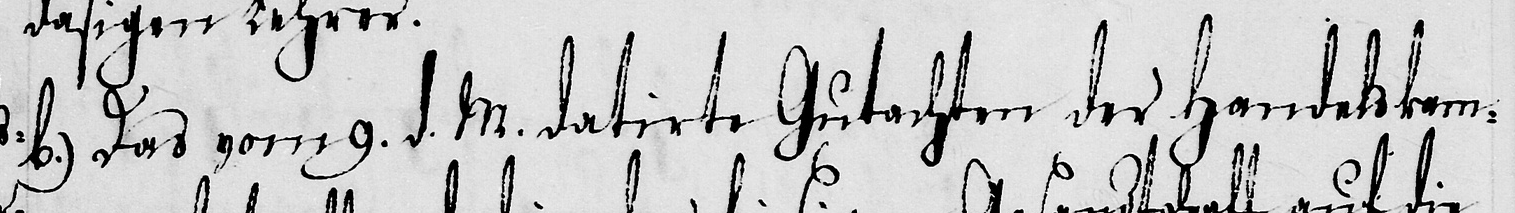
b.) Das vom 9. d. M. datirte Gutachten der Handelskam¬
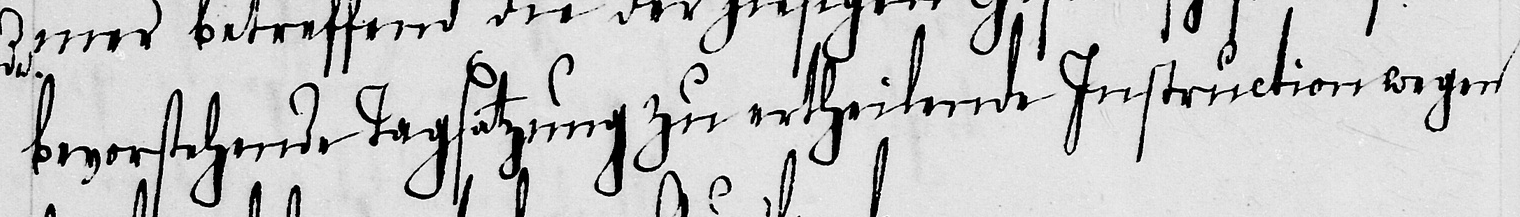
bevorstehende Tagsatzung zu ertheilende Instruction wegen
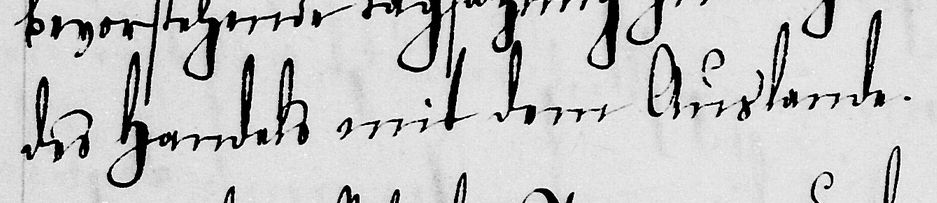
des Handels mit dem Auslande.
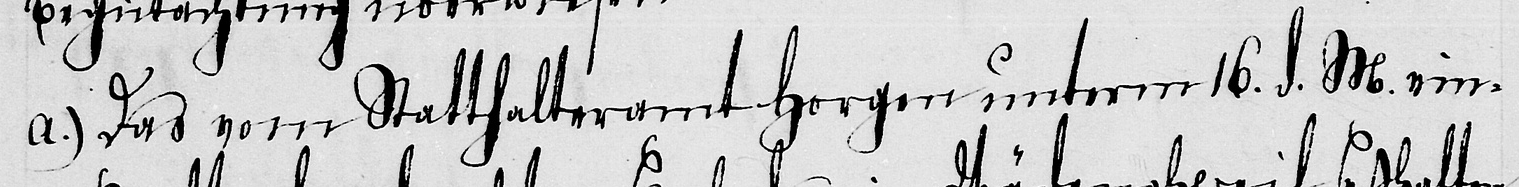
a.) Das vom Statthalteramt Horgen unterm 16. d. M. ein¬
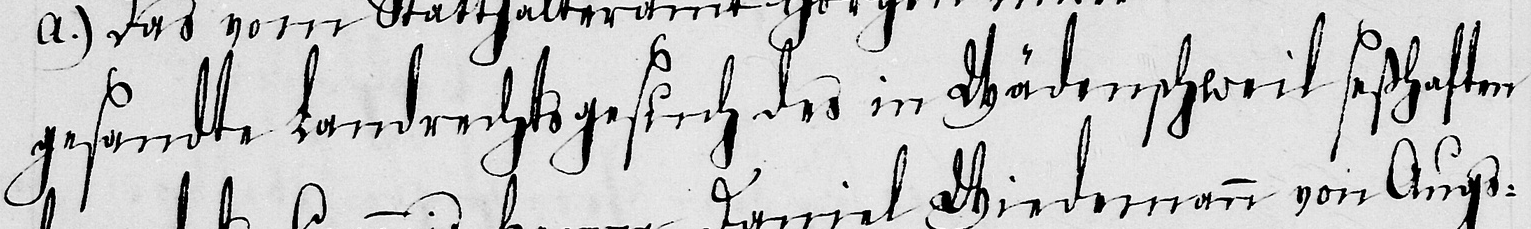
gesandte Landrechtsgesuch des in Wädenschweil seßhaften
